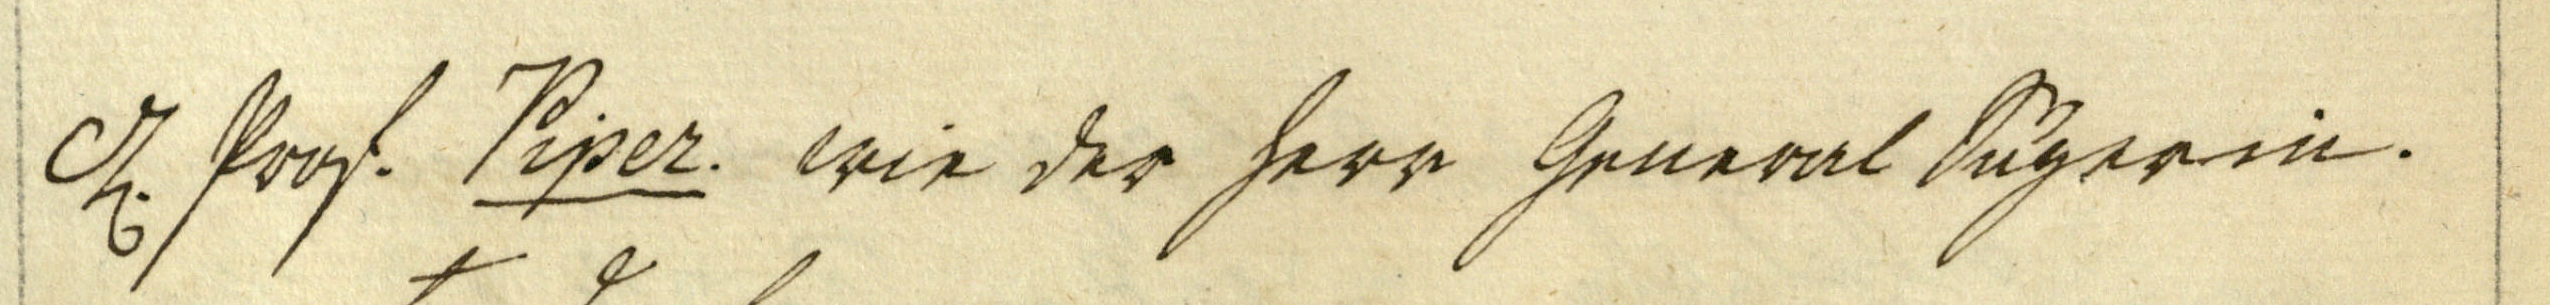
dh. Prof. Piper. wie der Herr General Superin¬
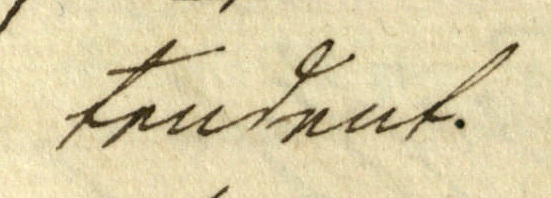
tendent.
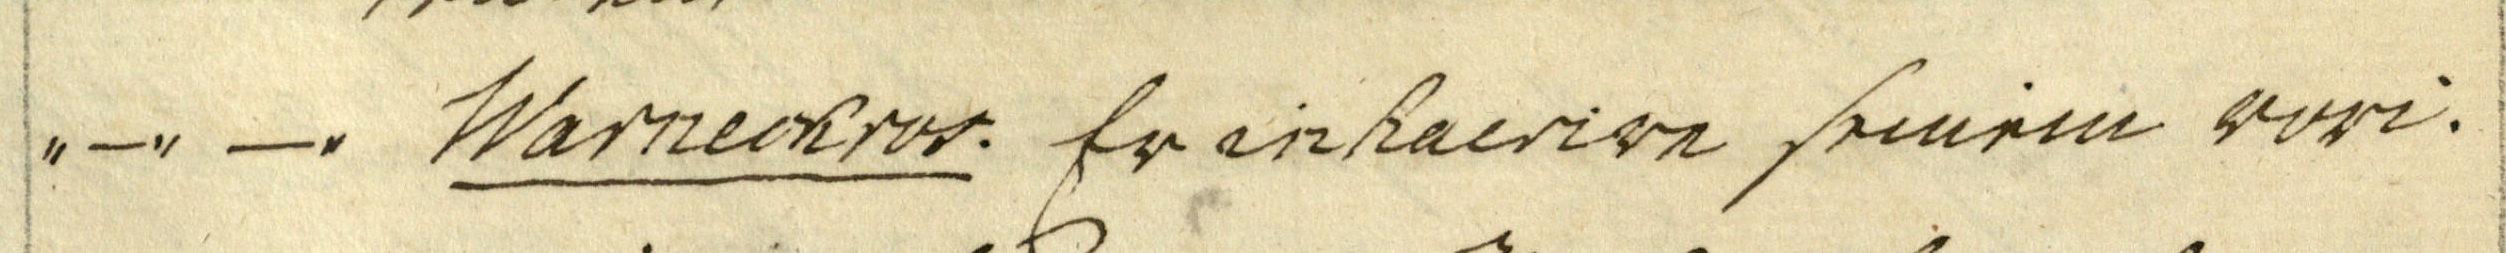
Warneckros. Er inhaerire seinem vori¬
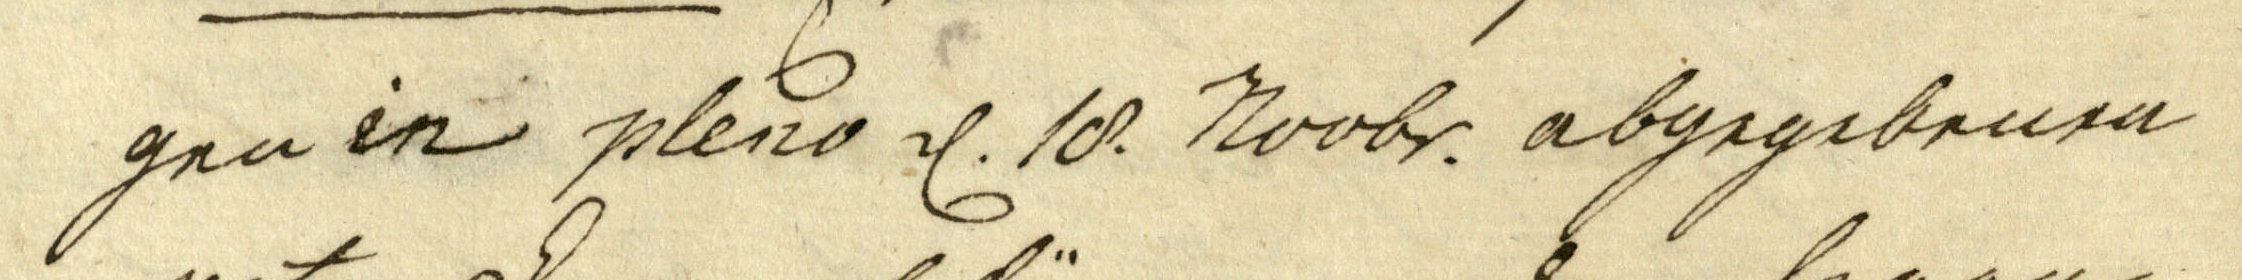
gen in pleno d. 18. Novbr. abgegebenen
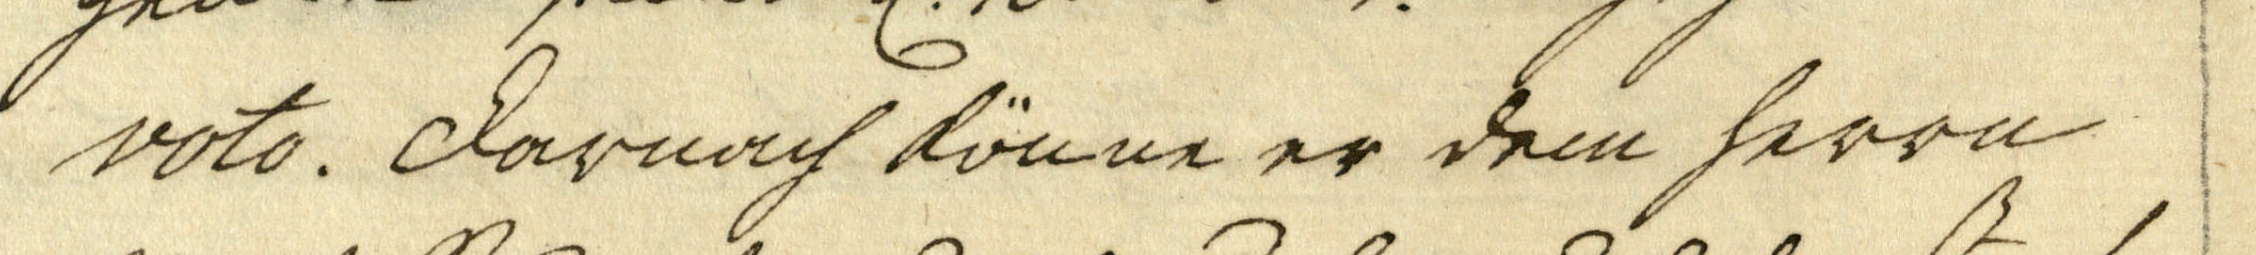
voto. Darnach könne er dem Herrn
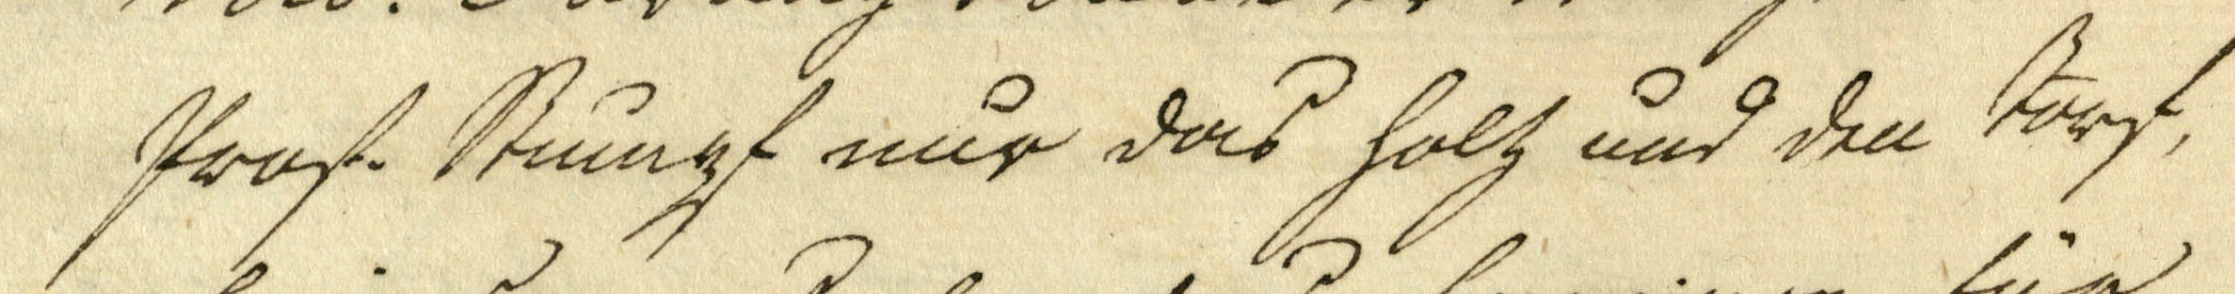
Prof. Stumpf nur das Holz und den Torf,
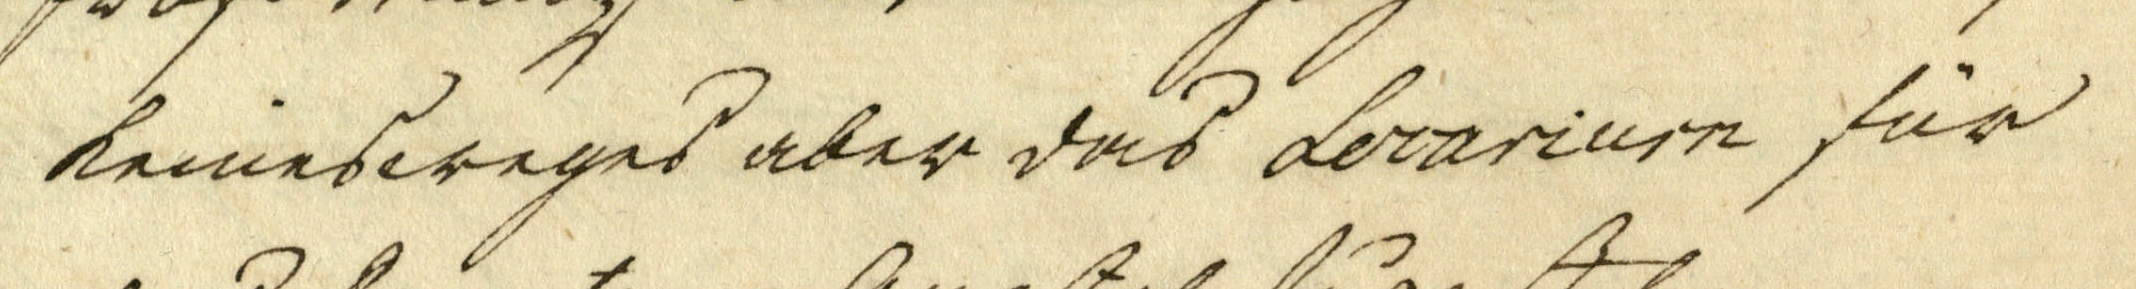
keinesweges aber das Locarium für
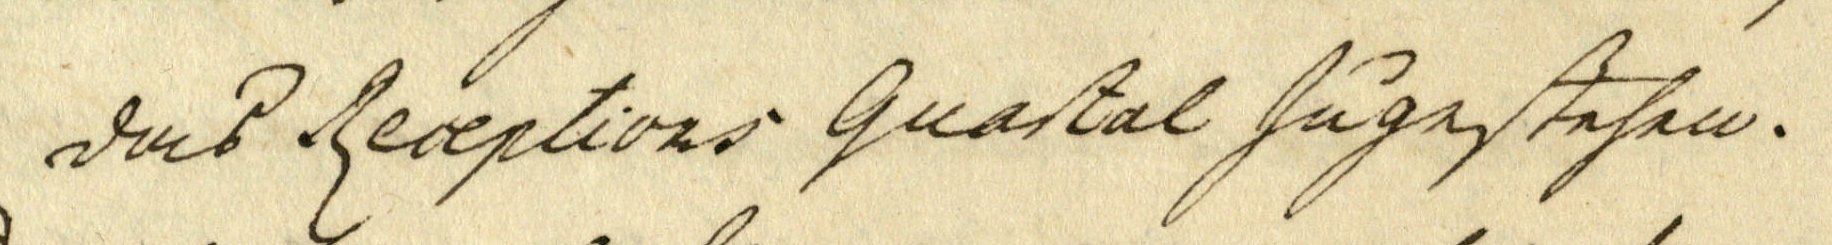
das Receptions Quartal zugestehen.
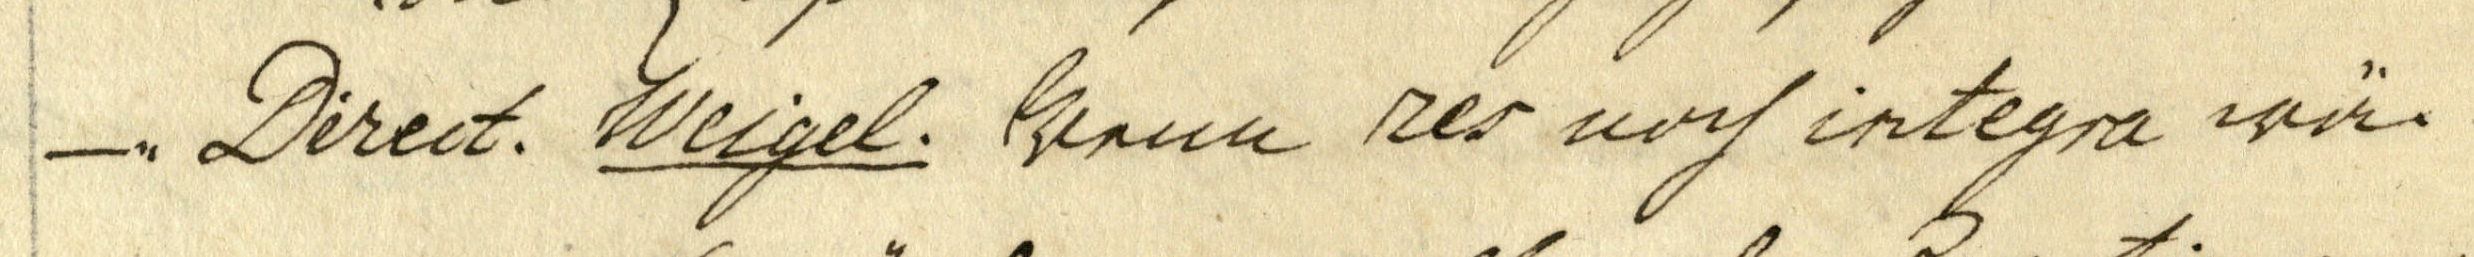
Direct. Weigel. Wenn res noch integra wä¬
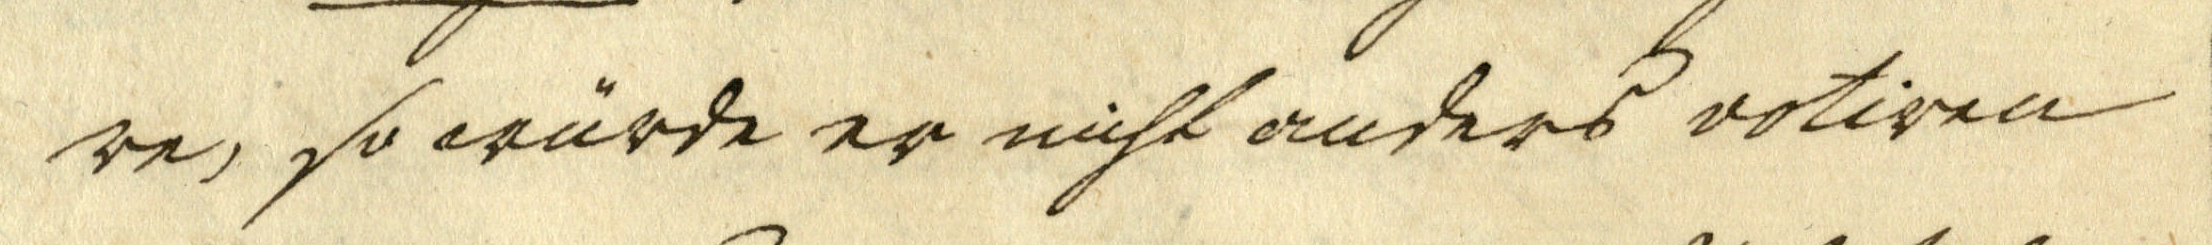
re, so würde er nicht anders votiren
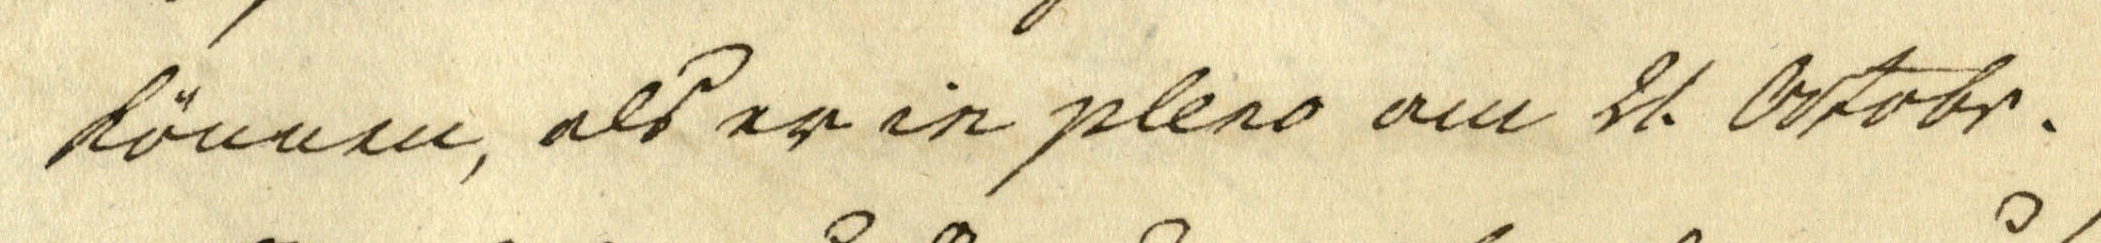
können, als er in pleno am 21. Octobr.
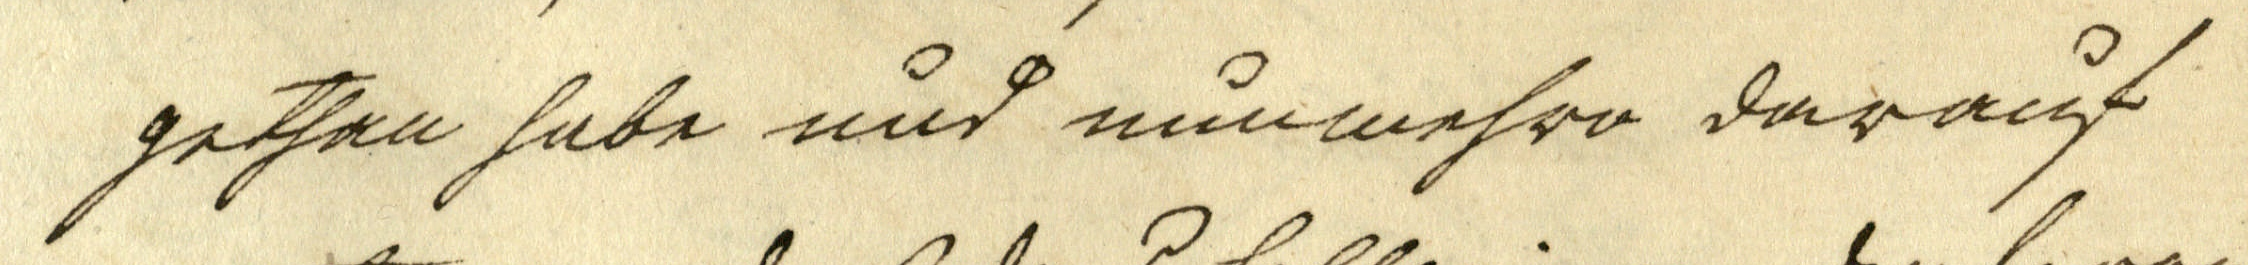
gethan habe und nunmehro darauf
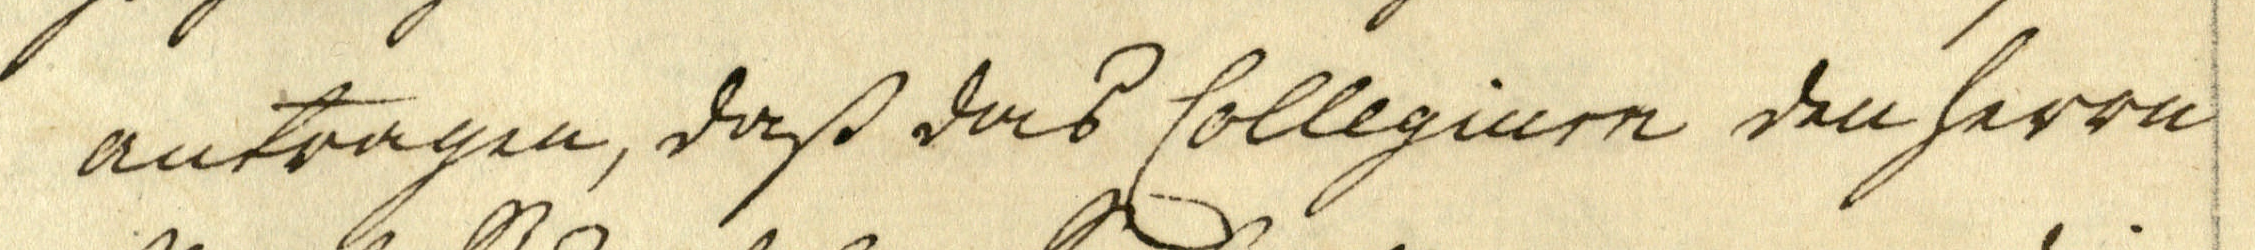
antragen, daß das Collegium den Herrn
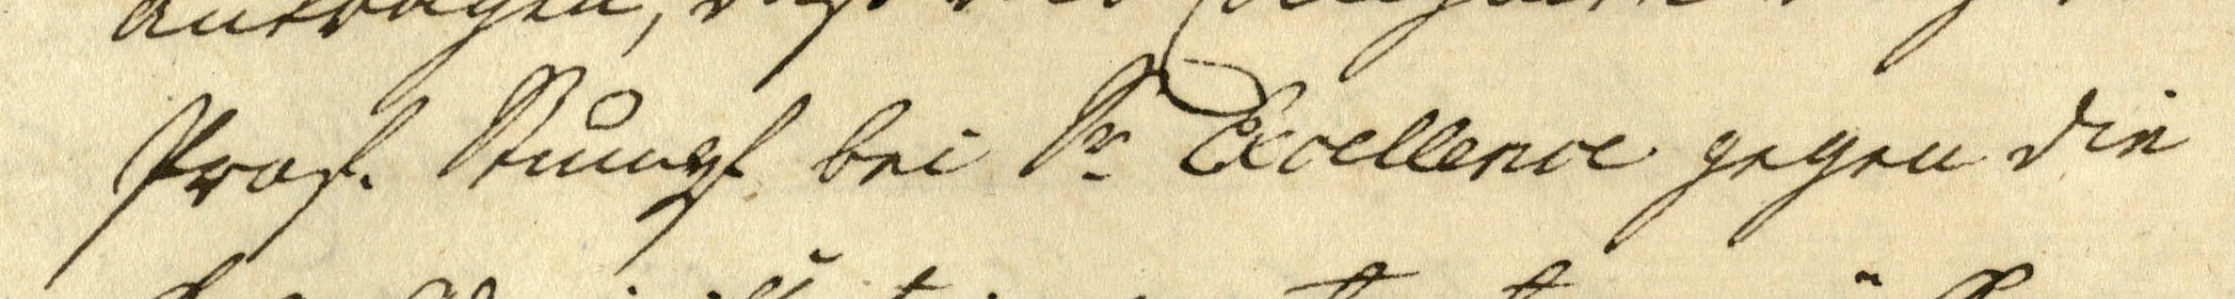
Prof. Stumpf bei Sr Excellence gegen die
